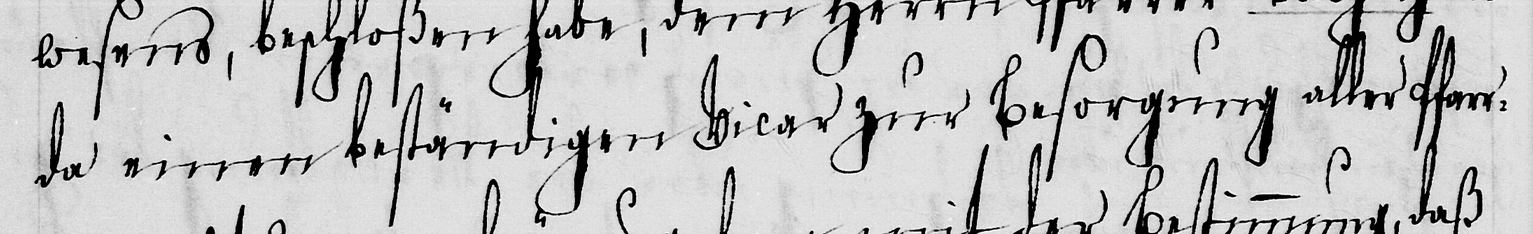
lda einen beständigen Vicar zur Besorgung aller Pfar¬
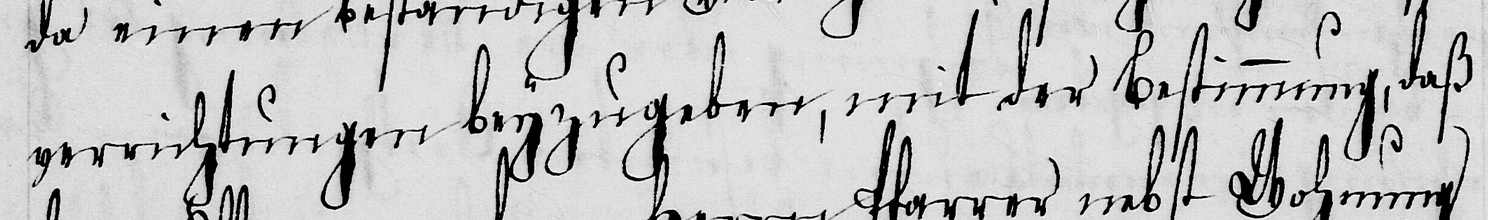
rverrichtungen beyzugeben, mit der Bestimmung, daß
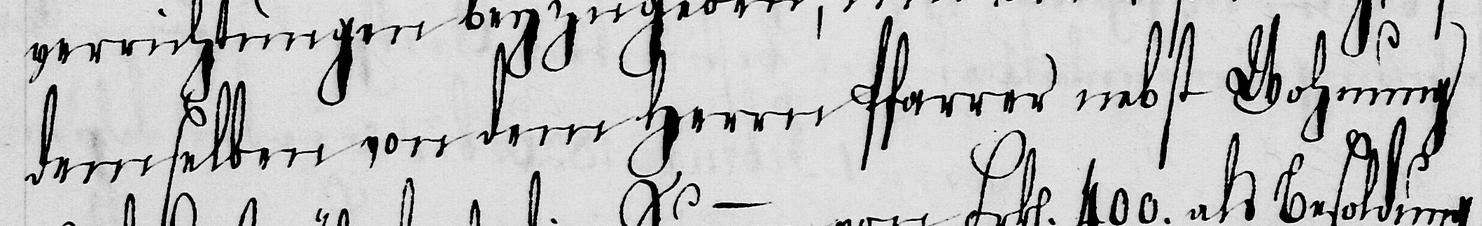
demselben von dem Herrn Pfarrer nebst Wohnung
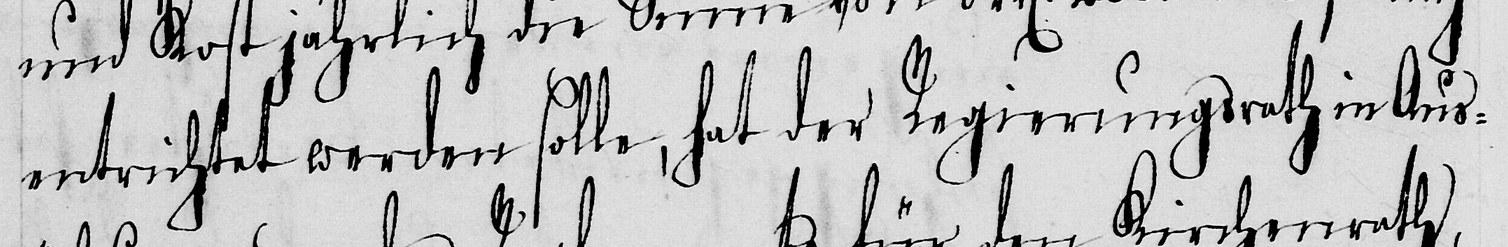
entrichtet werden solle, hat der Regierungsrath in Aus¬
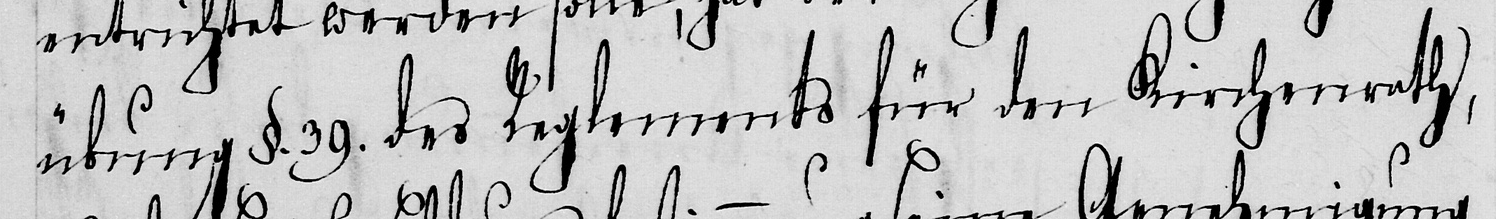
übung §. 39. des Reglements für den Kirchenrath,
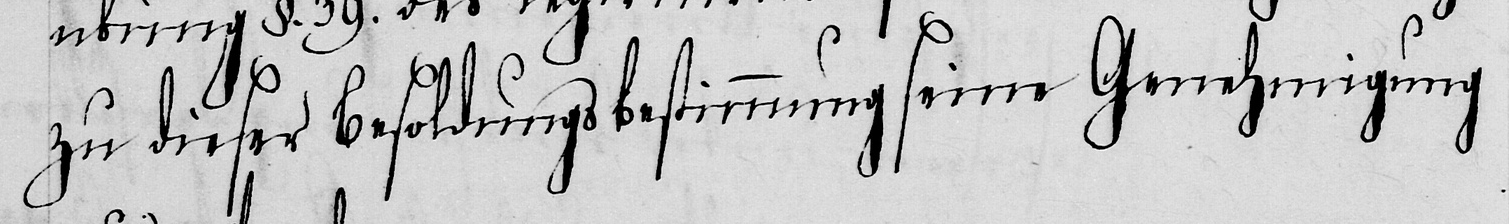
zu dieser Besoldungsbestimmung seine Genehmigung
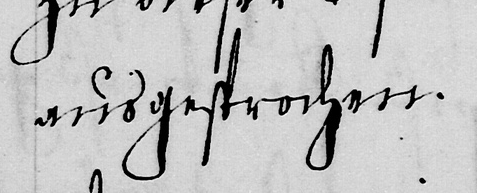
ausgesprochen.
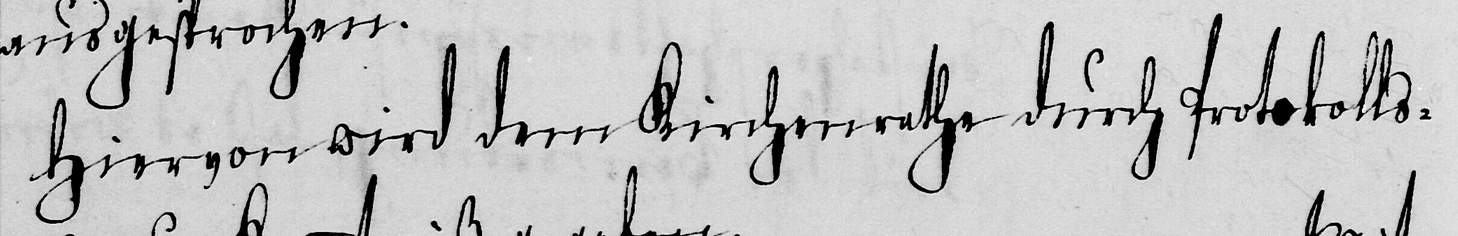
Hiervon wird dem Kirchenrathe durch Protokolls¬
